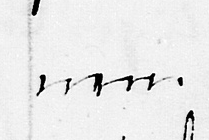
nen.
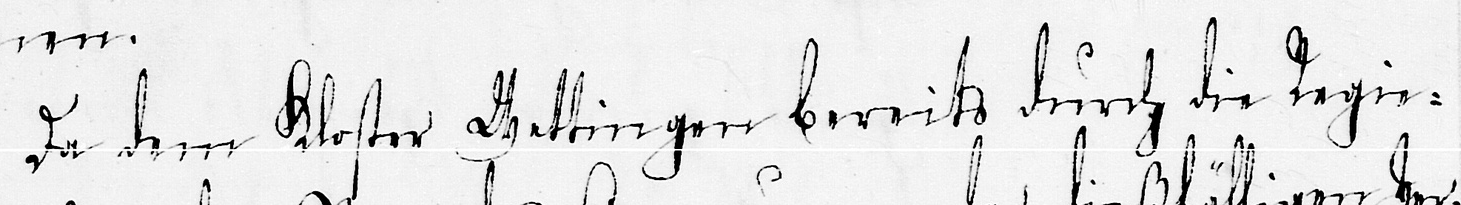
Da dem Kloster Wettingen bereits durch die Regie¬
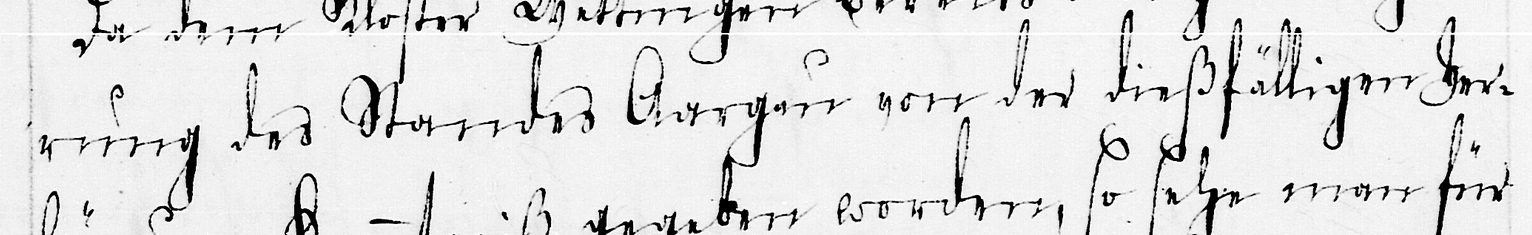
rung des Standes Aargau von der dießfälligen Ver¬
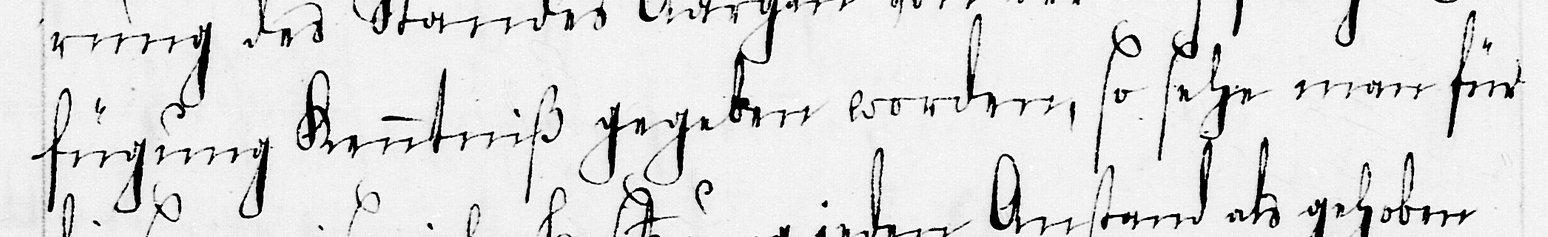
fügung Kenntniß gegeben worden, so sehe man für
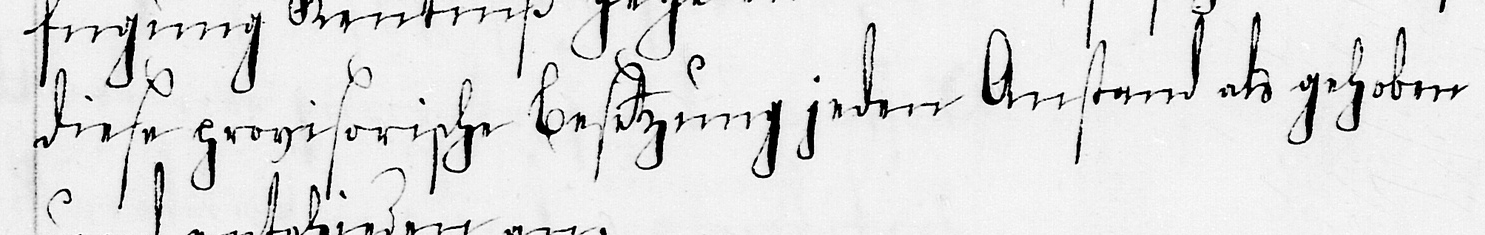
diese provisorische Besetzung jeden Anstand als gehoben
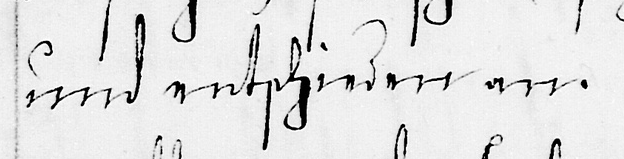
und entschieden an.
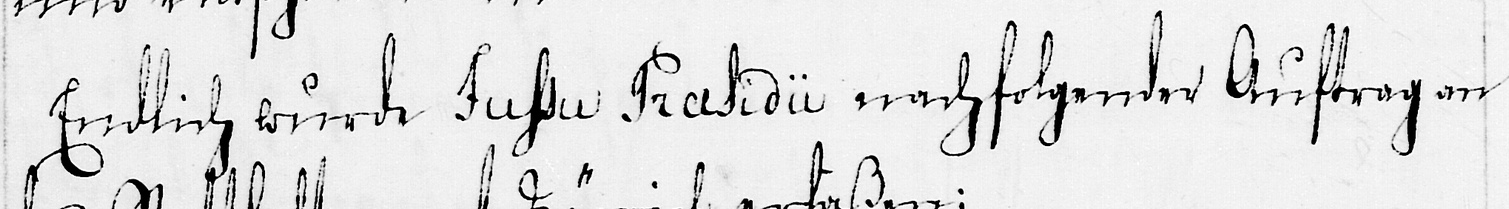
Endlich wurde Iussu Præsidii nachfolgender Auftrag an
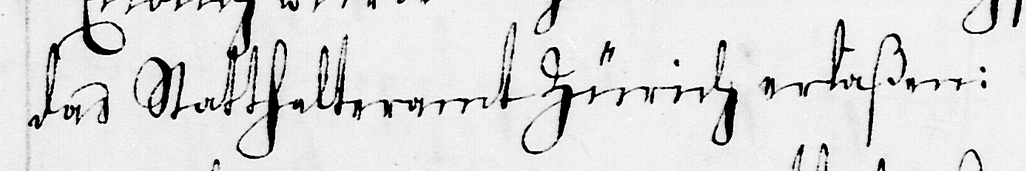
das Statthalteramt Zürich erlaßen:
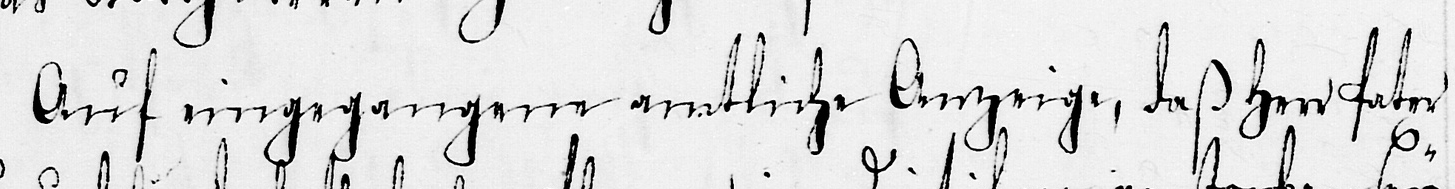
Auf eingegangene amtliche Anzeige, daß Herr Pater
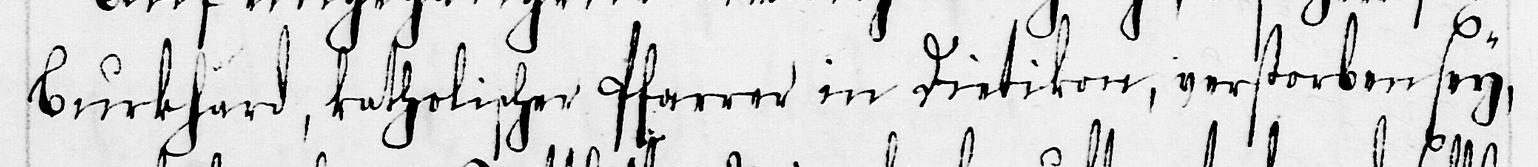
Burkhard, katholischer Pfarrer in Dietikon, verstorben sey,
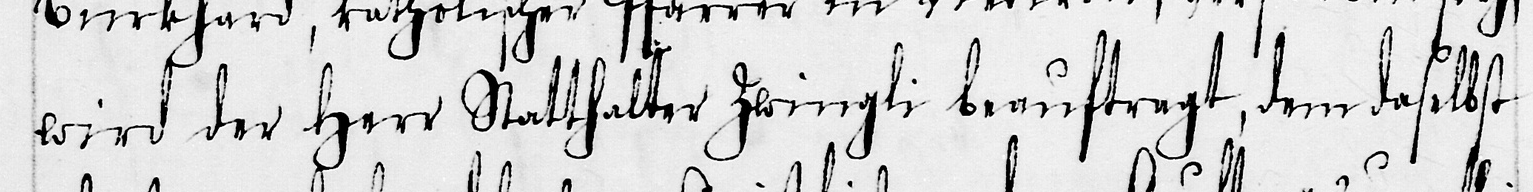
wird der Herr Statthalter Zwingli beauftragt, dem daselbst
